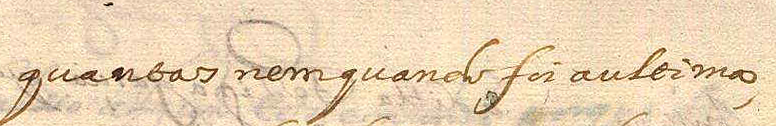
quantas nem quando foi a ultima,
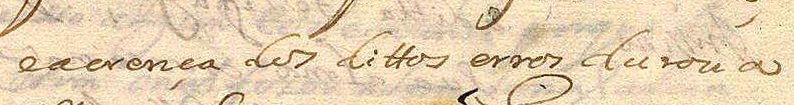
e a crença dos dittos erros durou a
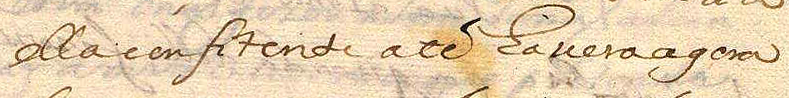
ella confitente até hauera agora
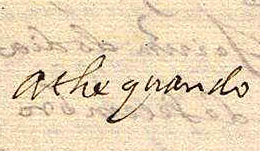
athe quando
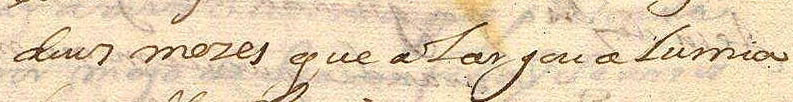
dous mezes que a Largou alumia
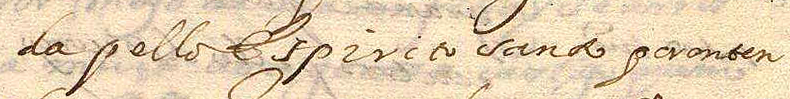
da pello Espirito santo por enten
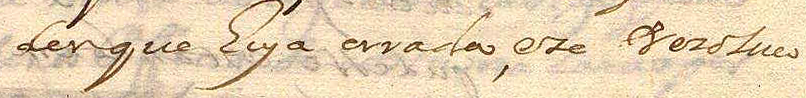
der que heya errada, e se rezolueo
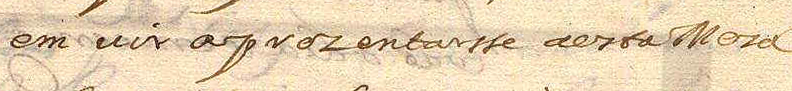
em uir aprezentarsse a esta Meza
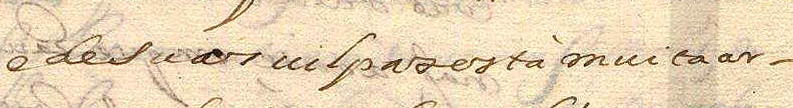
e de suas culpas esta muito ar
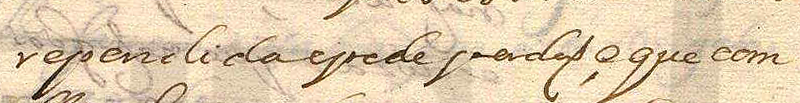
rependida e pede perdaõ, e que com
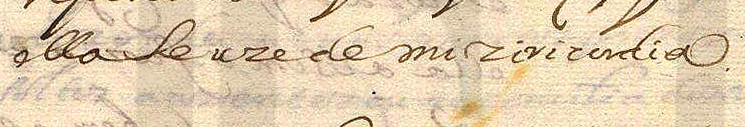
ella se uze de miziricordia.
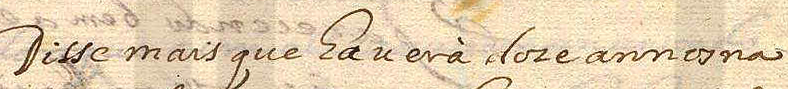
Disse mais que hauerà doze annos na
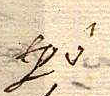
tpō
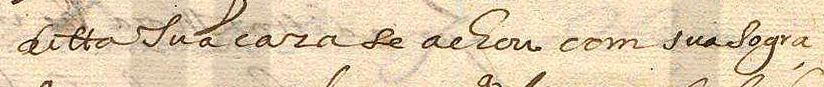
ditta sua caza se achou com sua sogra,
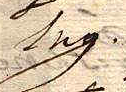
Lug.
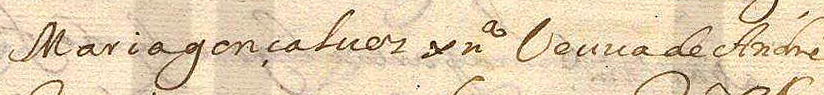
Maria gonçaluez xn Veuua de Andre
